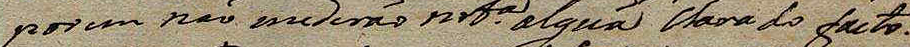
porem naõ me derão not.a alguā clara do facto.
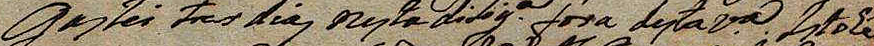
Gastei tres dias nesta dilig.a fóra desta V.a Isto hé
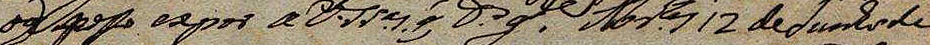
o q̄ posso expor a V.ss.as q̄ D.s g.de Abr.tes 12 de Junho de
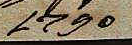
1790
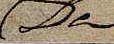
De
